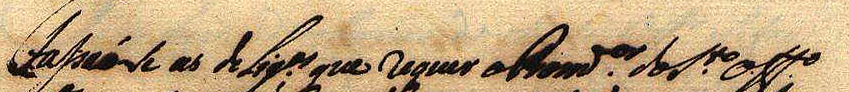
Fassaõse as delig.as que requer o Prom.tor do S.to Off.o
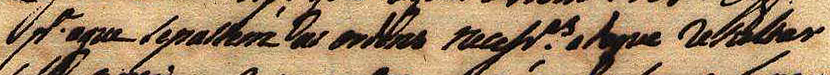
p.a o que se passem as ordens necess.as do que resultar
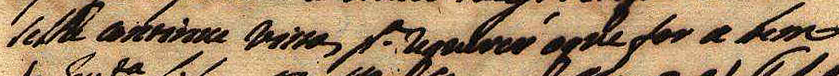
selhe continue vista p.a requerer o que for a bem
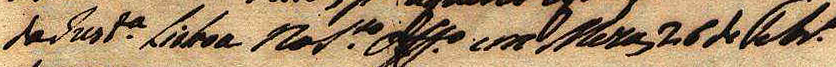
da Iust.a Lisboa no S.to Off.o em Meza, 26 de Febr.o
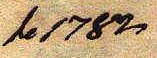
de 1782
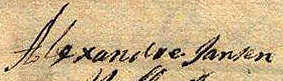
Alexandre Iansen
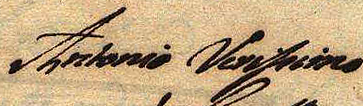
Antonio Verissimo
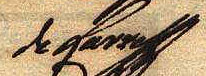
de Larre
